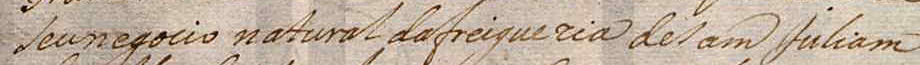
seu negocio natural da freiguezia de sam Juliam
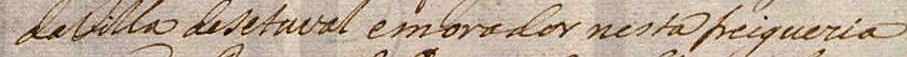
da Villa de setuval e morador nesta freguezia
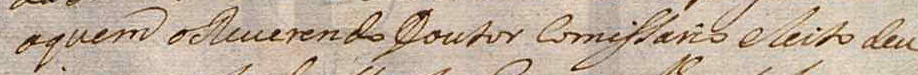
a quem o Reuerendo Doutor Comissario eleito deu
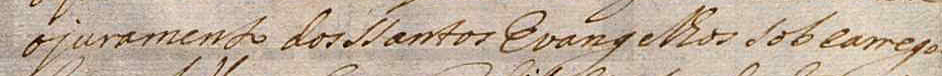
o juramento dos ssantos Evangelhos sob carrego
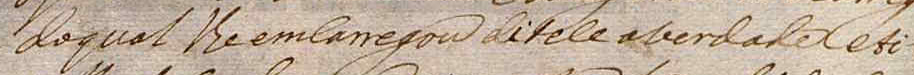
do qual lhe emCarregou disece a verdade e ti
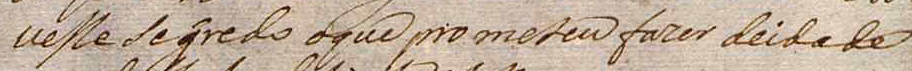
uesse segredo o que prometeu fazer de idade
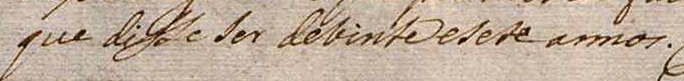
que disse ser de vinte e sete annos.
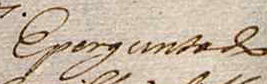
E perguntado
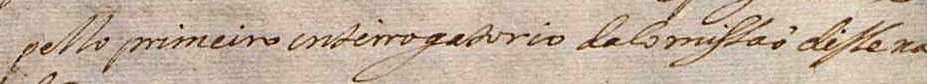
pello primeiro interrogatorio da Comissaõ disse na
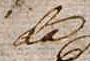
da
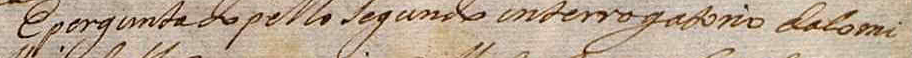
E perguntado pello segundo interrogatorio da comi
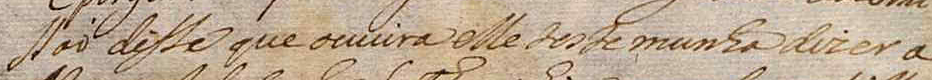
ssaõ disse que ouuira elle testemunha dizer a
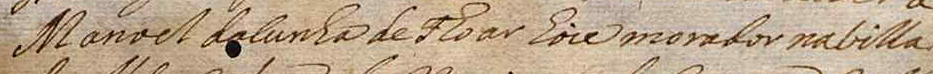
Manoel da Cunha de Thoar hoie morador na villa
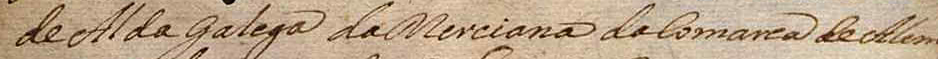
de Alda Galega da Merciana da Comarca de Alem
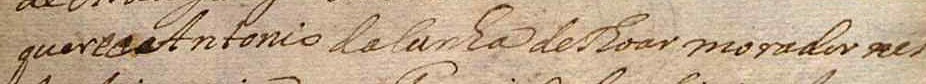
quer e a Antonio da Cunha de Thoar morador nes
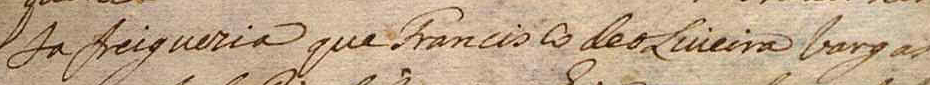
ta freiguezia, que Francisco de oLiueira Vargas
